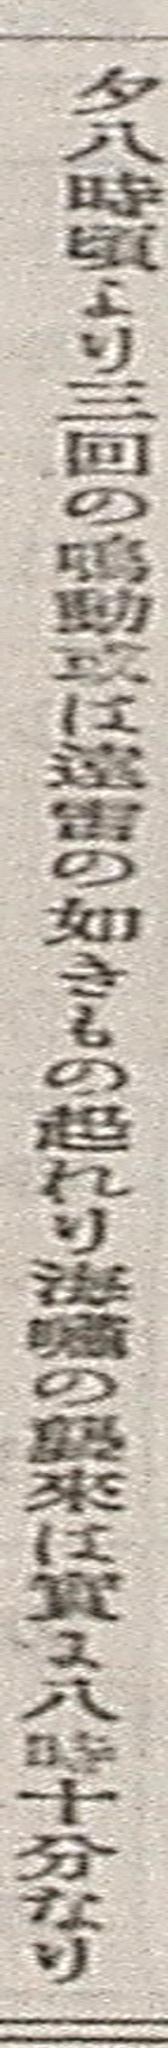夕八時頃より三回の鳴動或は遠雷の如きもの起れり海嘯の襲来は実に八時十分なり
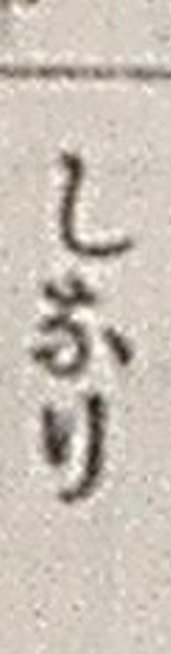しなり
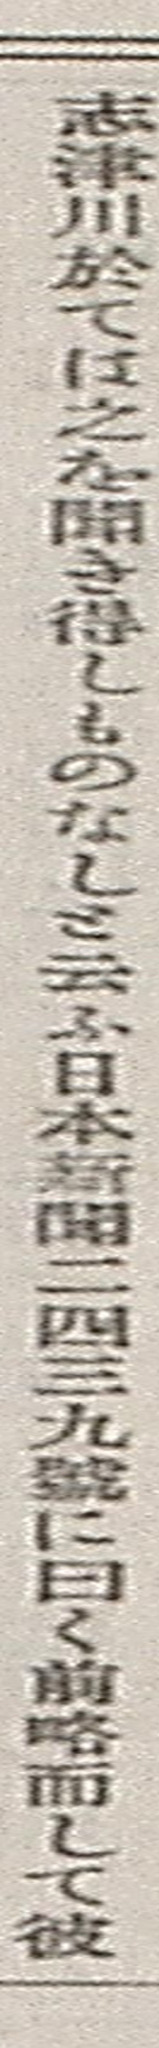志津川於ては之を聞き得しものなしと云ふ日本新聞二四三九号に曰く前略而して彼
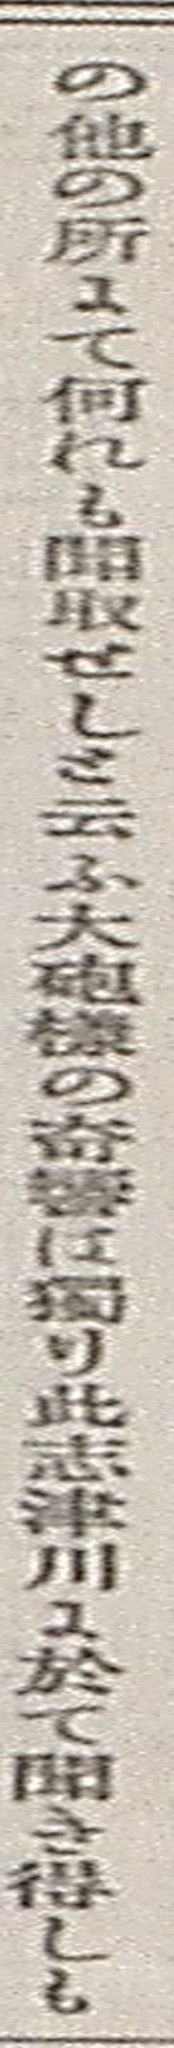の他の所にて何れも聞取せしと云ふ大砲様の奇響は独り此志津川に於て聞き得しも
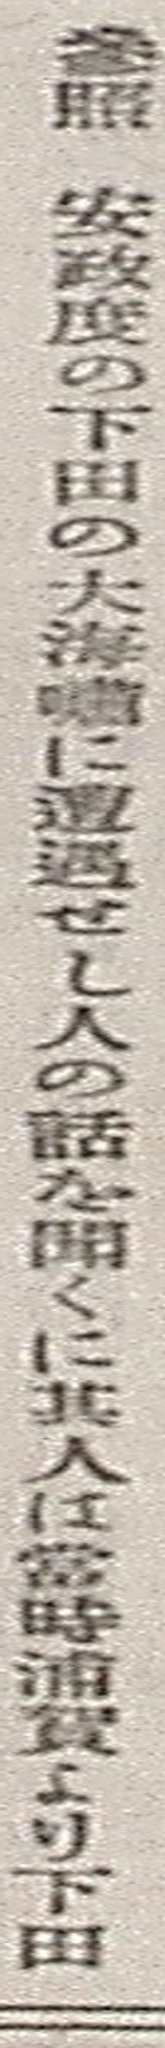参照安政度の下田の大海嘯に遭遇せし人の話を聞くに其人は当時浦賀より下田
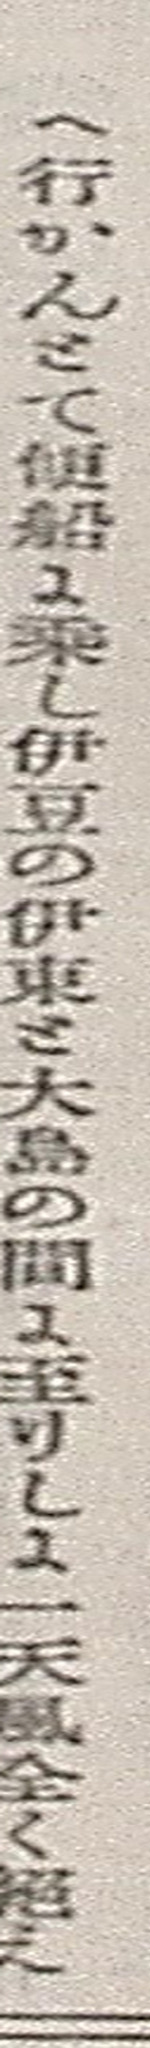へ行かんとて便船に乗し伊豆の伊東と大島の間に至りしに一天風全く絶え
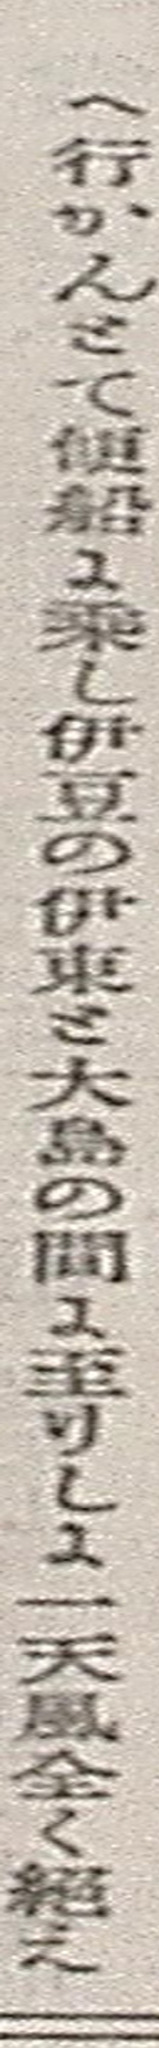へ行かんとて便船に乗し伊豆の伊東と大島の間に至りしに一天風全く絶え
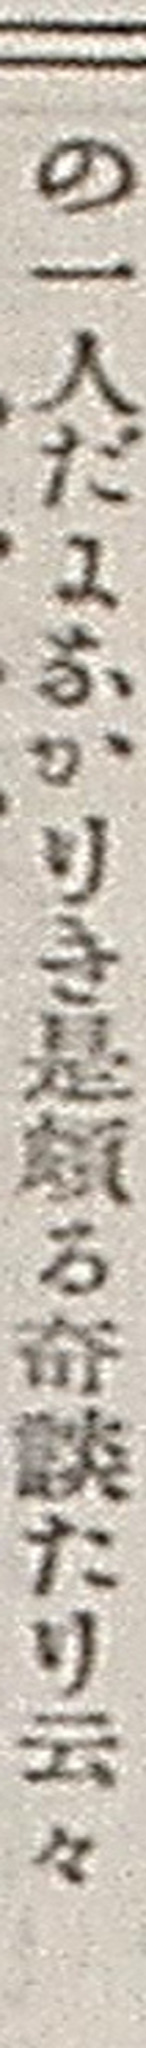の一人だになかりき是頗る奇談たり云々
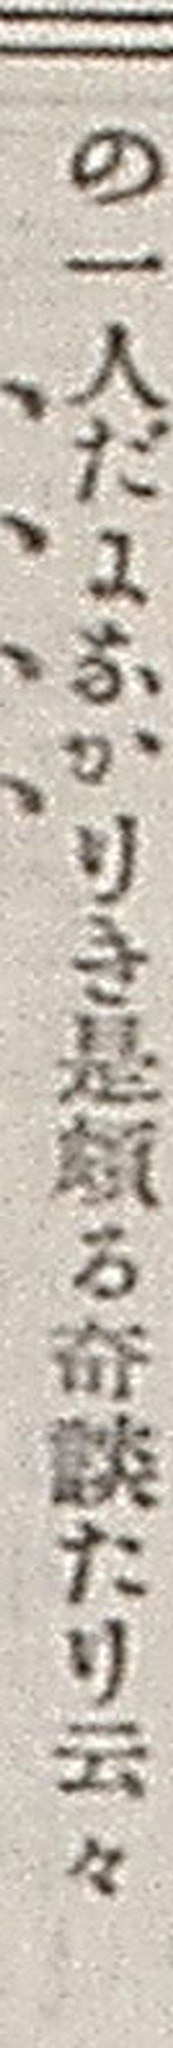の一人だになかりき是頗る奇談たり云々
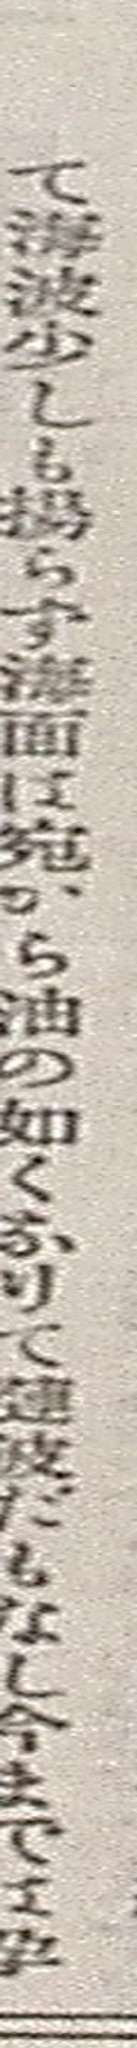て海波少しも揚らず海面は宛から油の如くなりて漣波だもなし今までは孕
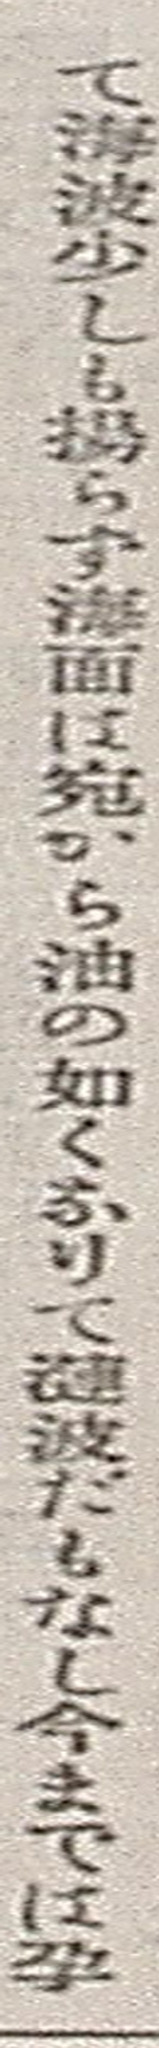て海波少しも揚らず海面は宛から油の如くなりて漣波だもなし今までは孕
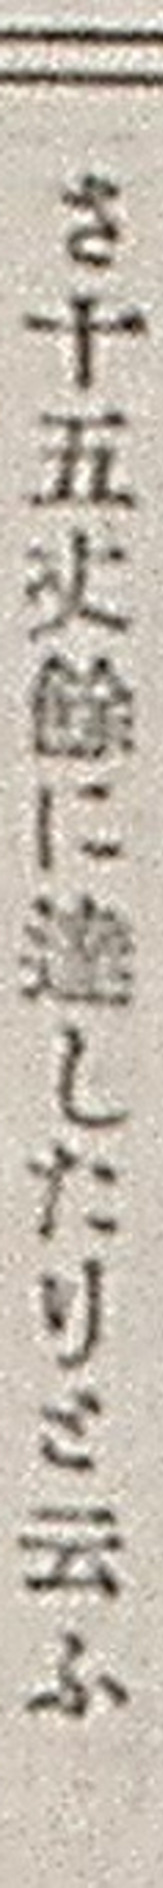さ十五丈余に達したりと云ふ
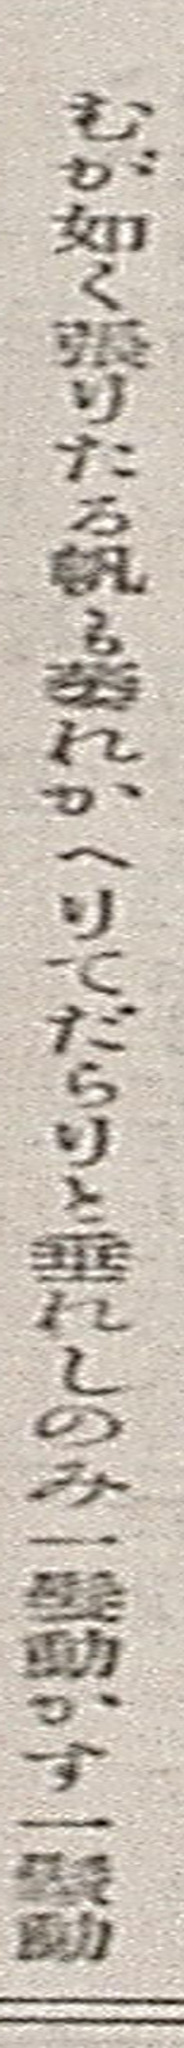むが如く張りたる帆も萎れかへりてだらりと垂れしのみ一髪動かず一髪動
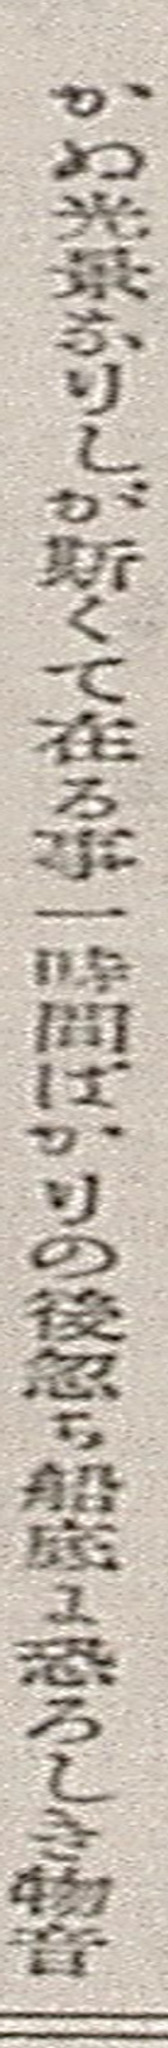かぬ光景なりしが斯くて在る事一時間ばかりの後忽ち船底に恐ろしき物音
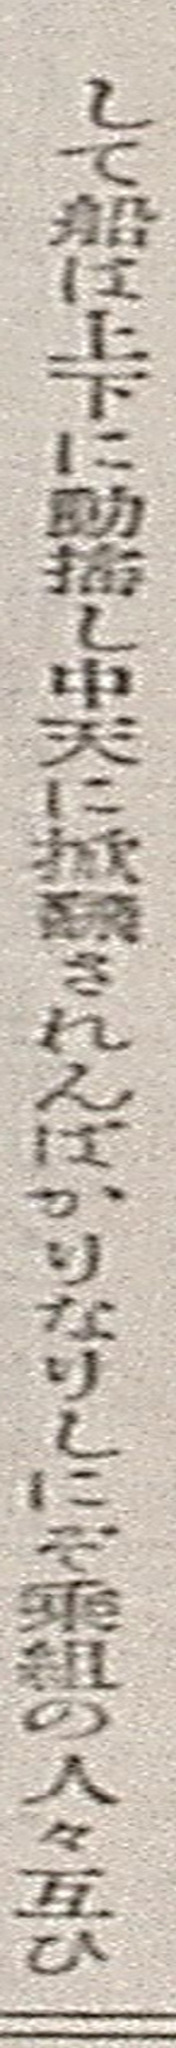して船は上下に動揺し中天に掀飜されんばかりなりしにぞ乗組の人々互ひ
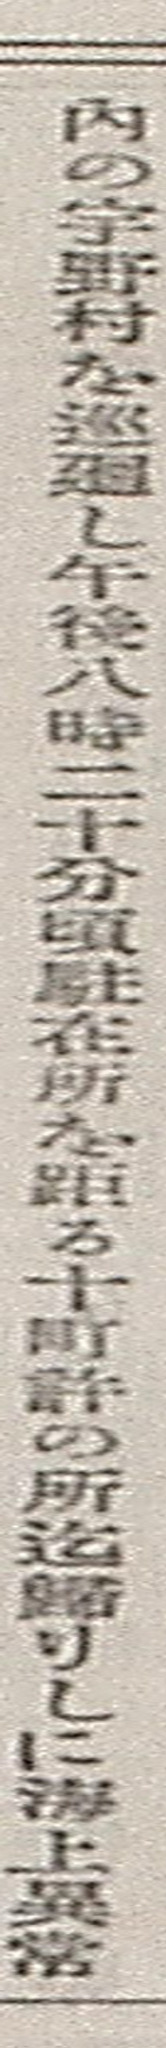内の宇野村を巡廻し午後八時二十分頃駐在所を距る十町許の所迄帰りしに海上異常
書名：風俗畫報臨時増刊第百十九號　大海嘯被害録（中）
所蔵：東京大学地震研究所図書室 Earthquake Research Institute Library, The University of Tokyo, JAPAN
